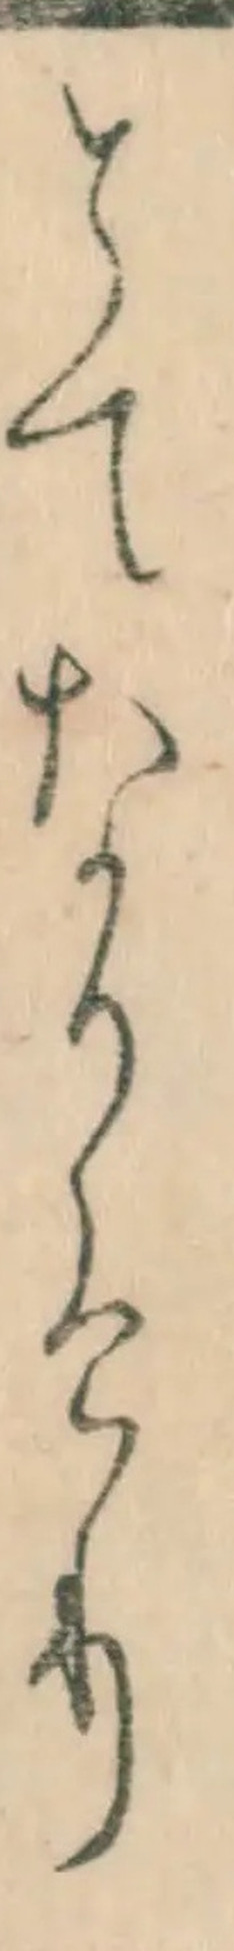とてなりけり
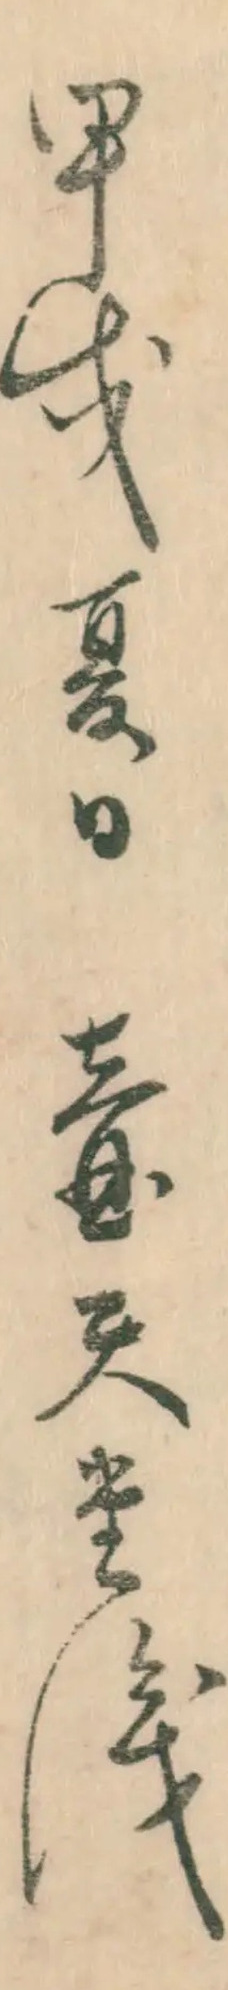申戌夏日壺天堂浅

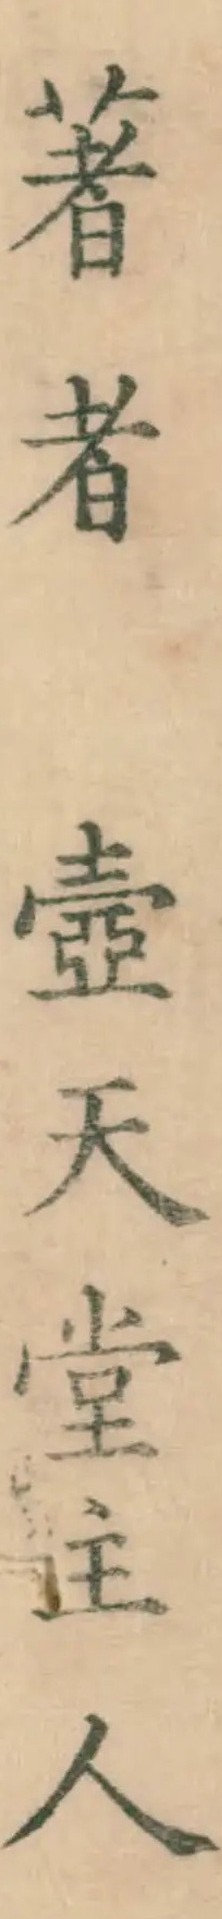著者壺天堂主人
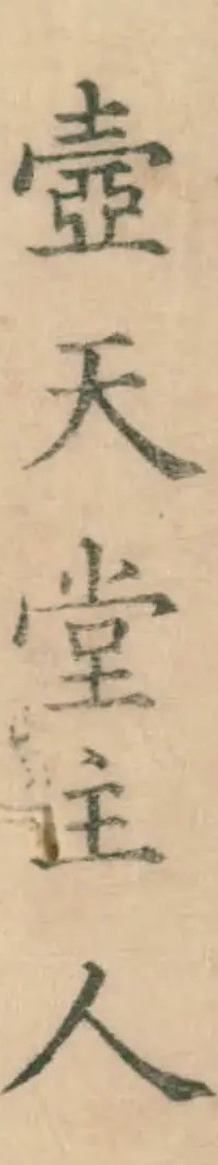著者壺天堂主人
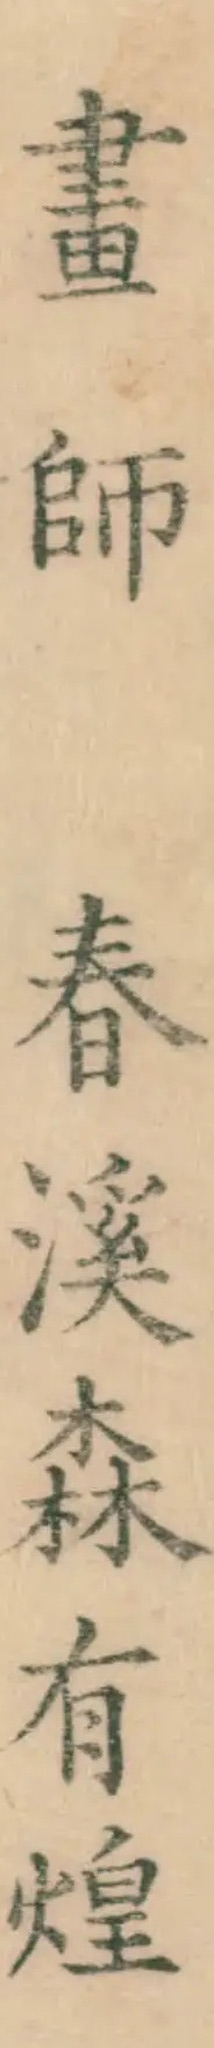書師春渓森有煌
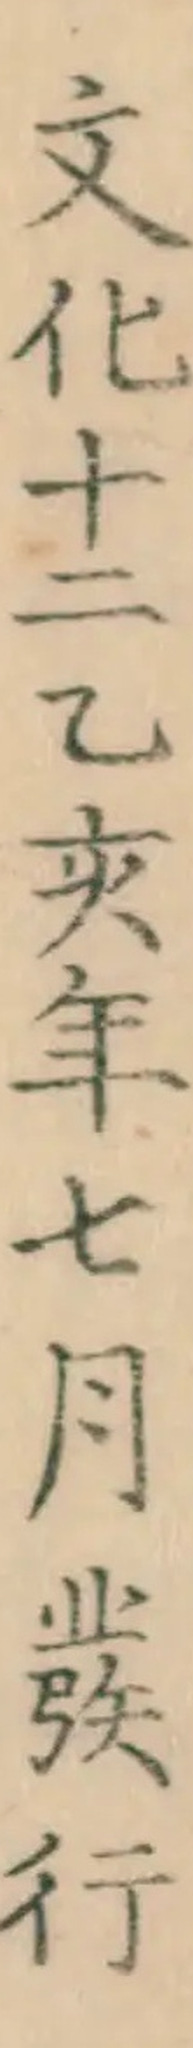文化十二乙亥年七月発行
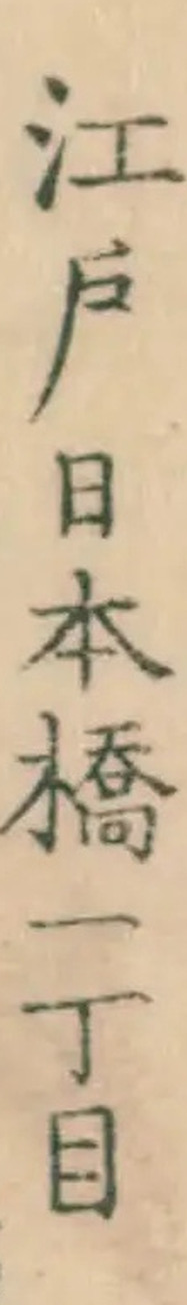江戸日本橋一丁目
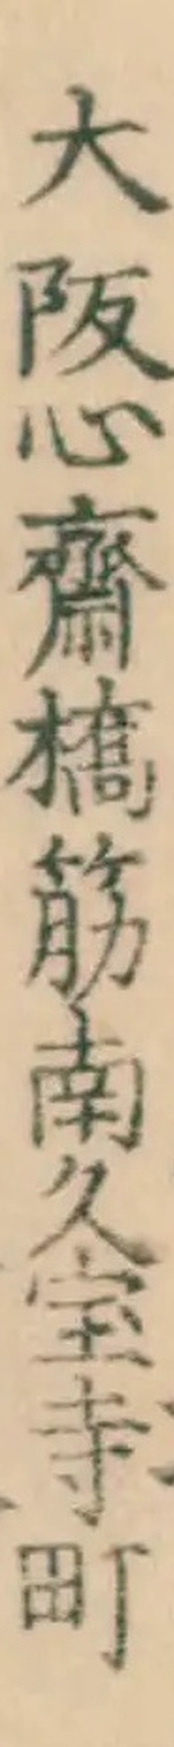大坂心斎橋筋南久宝寺町
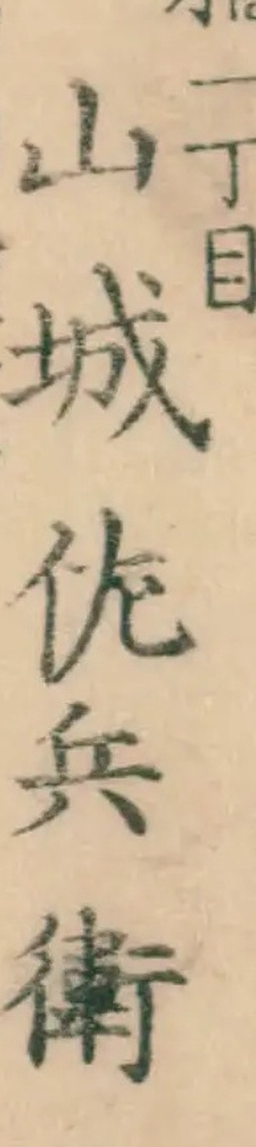山城佐兵衛
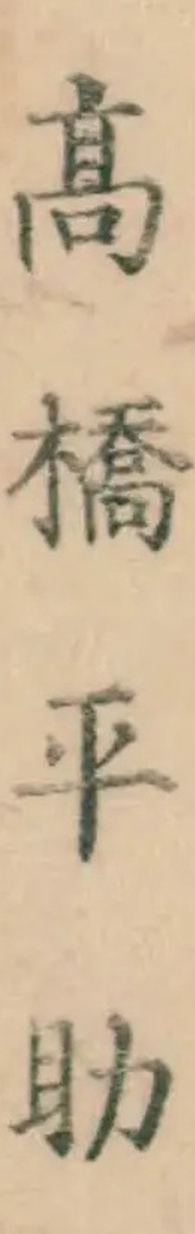高橋平助
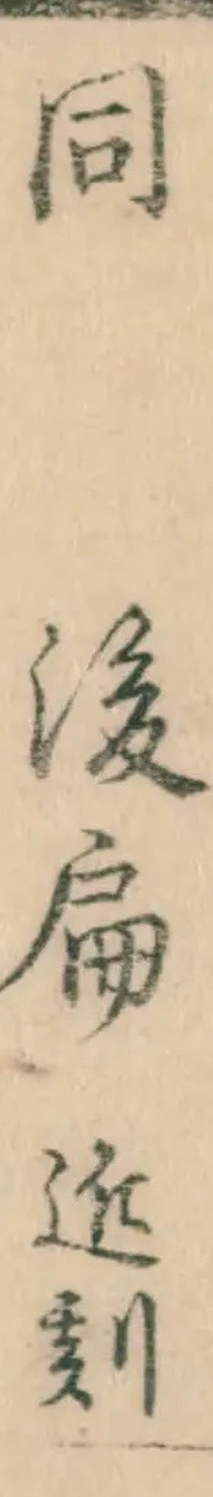同後篇近刻
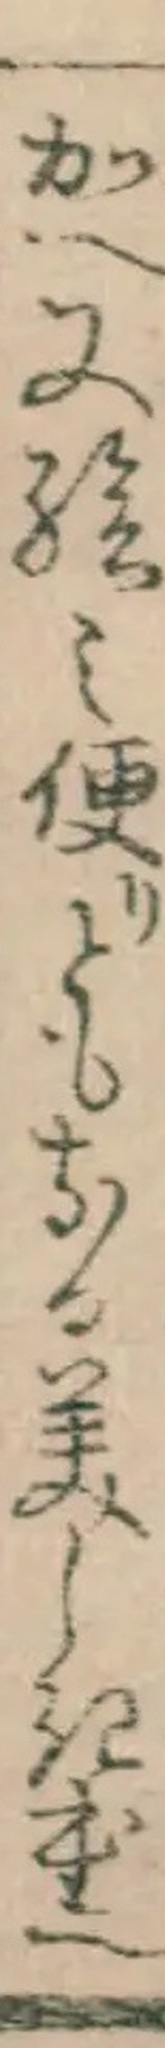加へ又絵の便りともなる美し記述
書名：花壇朝顔通 2巻. [2]
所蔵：国立国会図書館 National Diet Library, JAPAN
